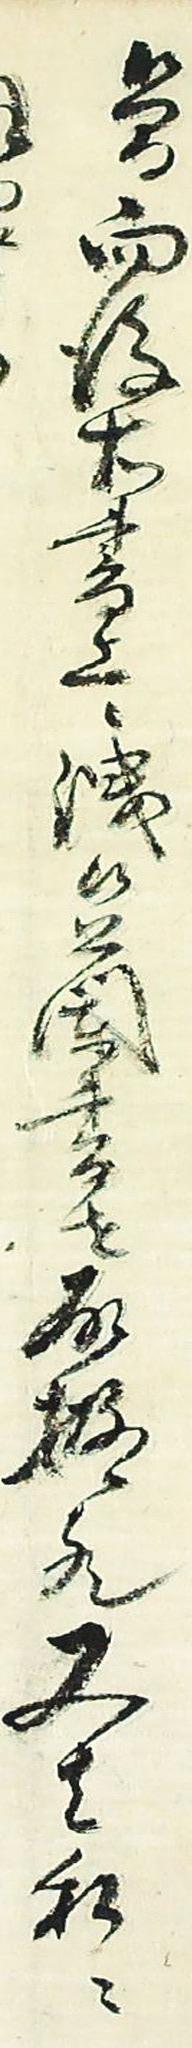候間向後右書上に洩候蘭書を取扱候欤又は私に
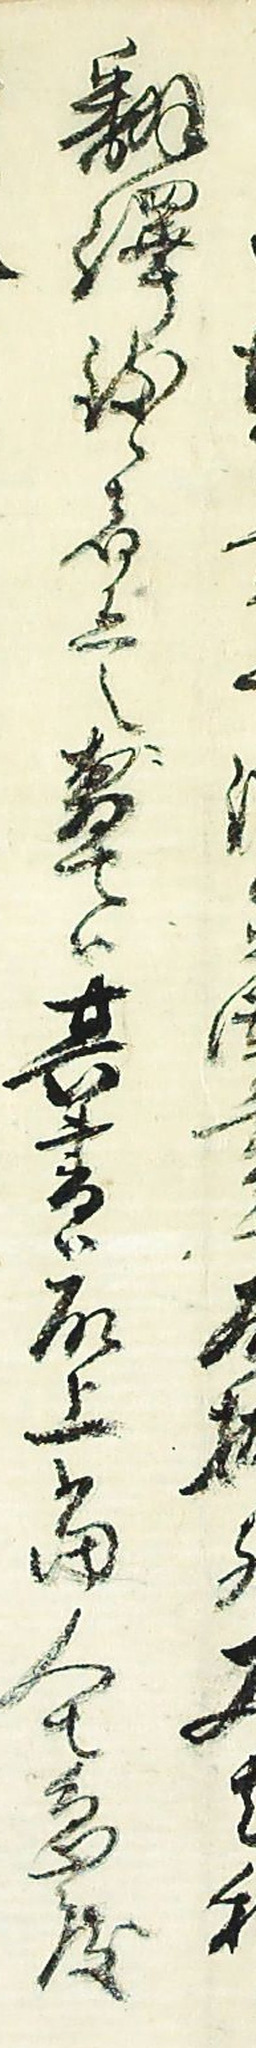翻訳致候者有之におゐては其書は取上当人は急度
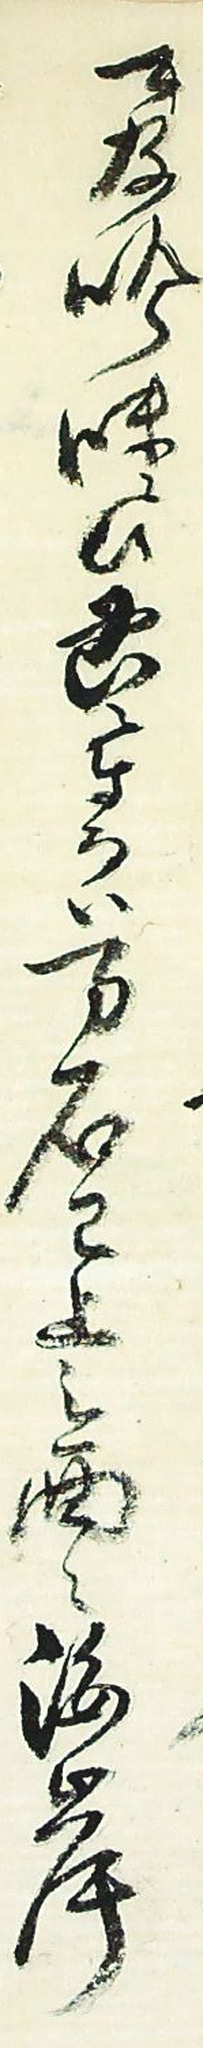可及吟味に候右に付而は万石已上之面々海岸
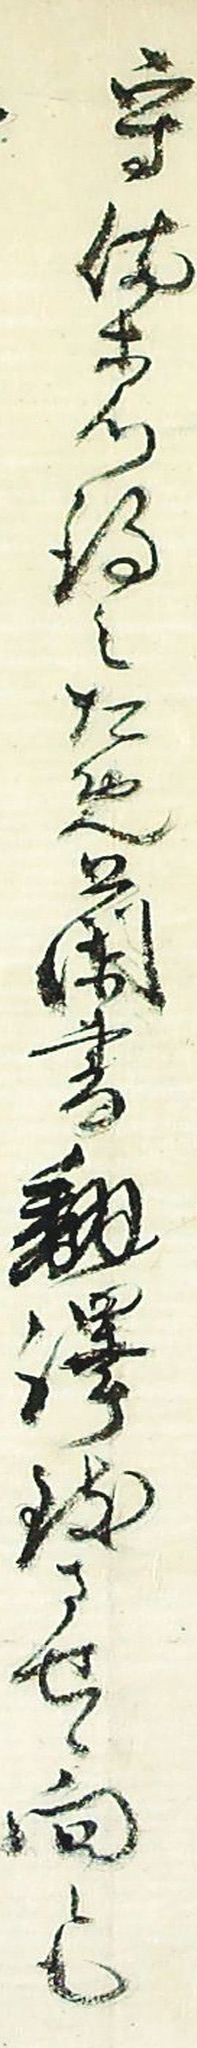守備等心得之ため蘭書翻訳致させ候向にも
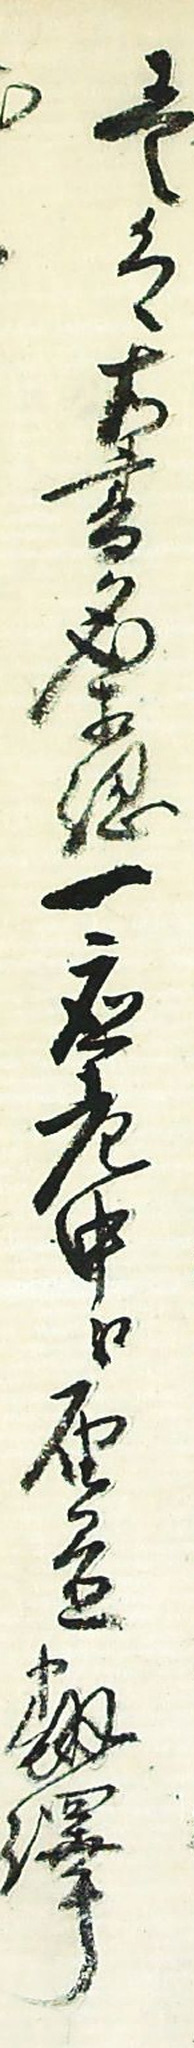有之候はゝ右書名相認一応老中江届置翻訳
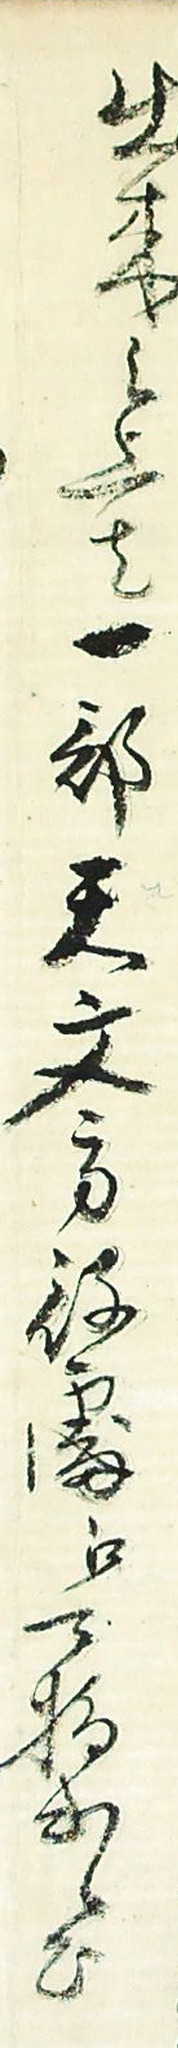出来之上は一部天文方役処江可指出候以上
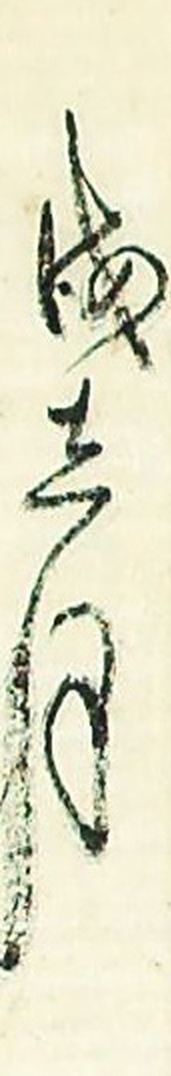戌十二月
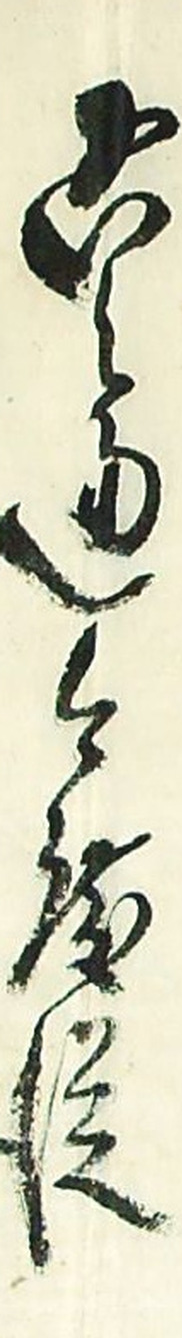右之通今度従
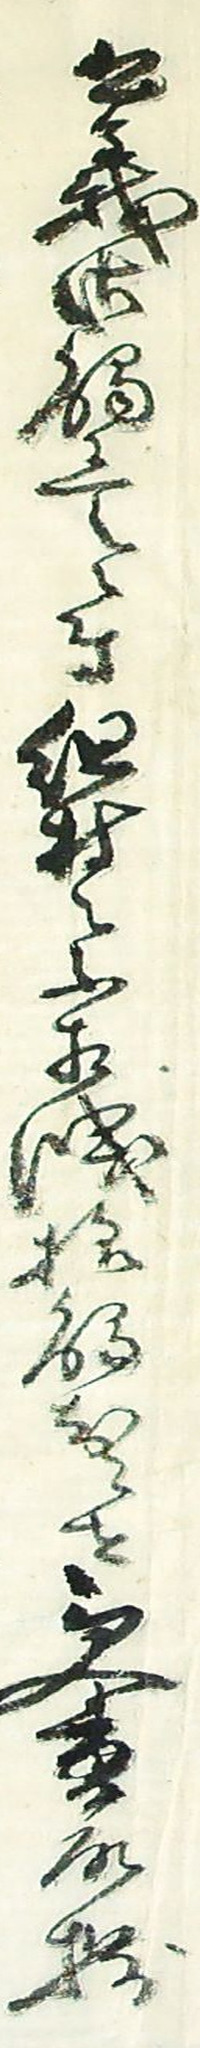公義御触有之に付組村々不相洩様触知らせ受書取揃
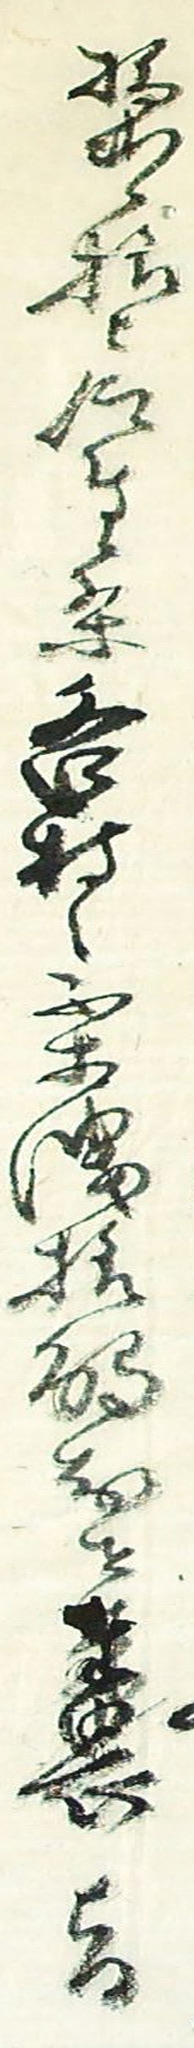指出候様被仰付候条各村々不相洩様触知せ奉畏旨
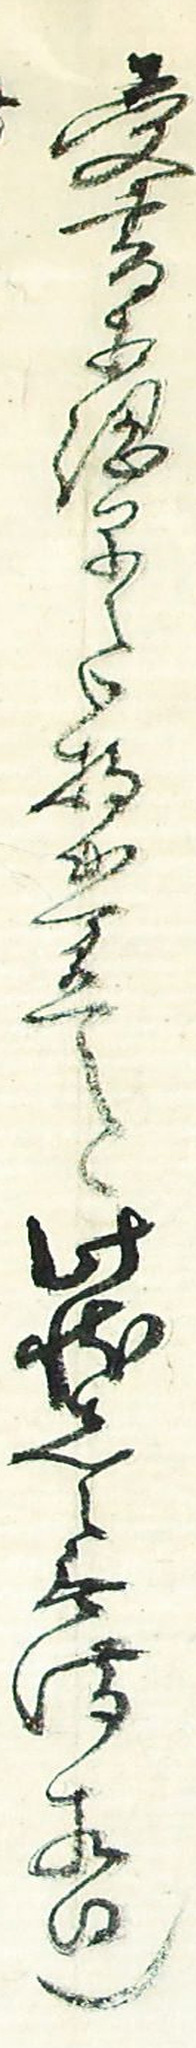受書相認早々御指出可有之候此状先々無滞相廻
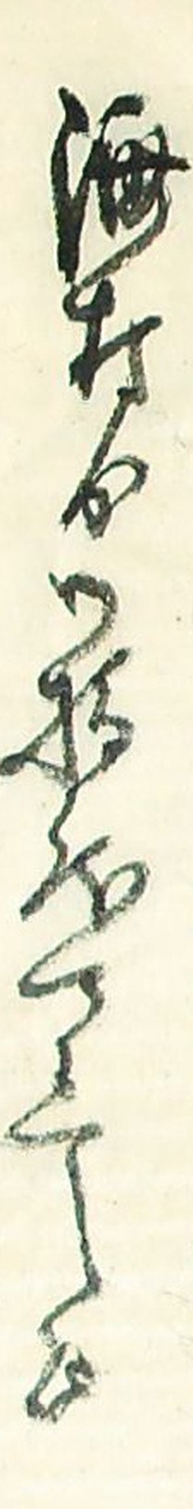済村ゟ御指戻可有之候以上
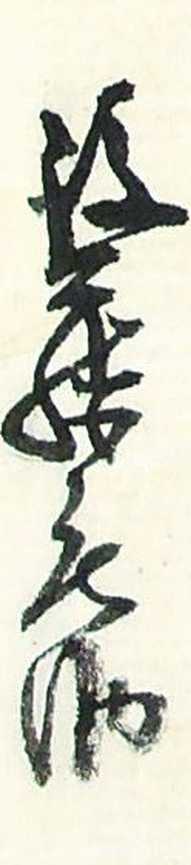後藤庄助
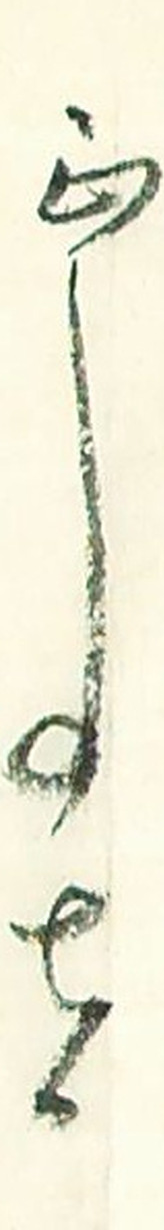正月七日
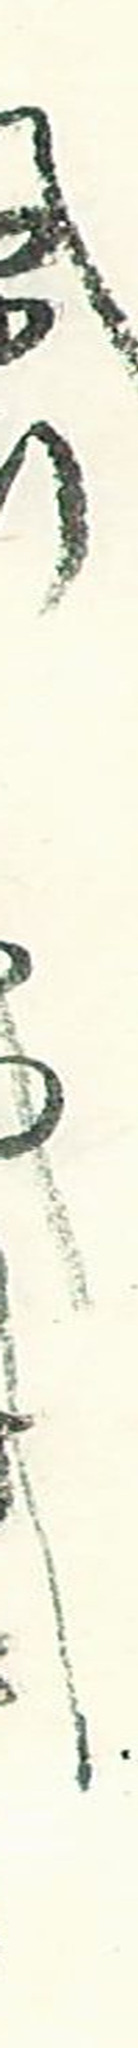早淵和田府中

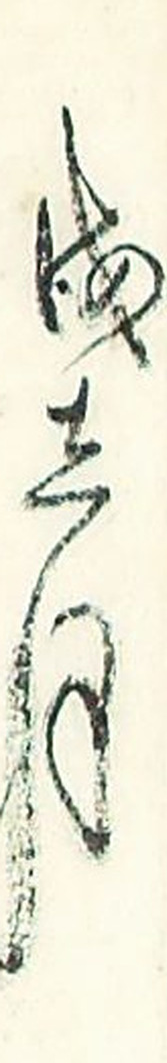戌十二月
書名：諸御用御□受書控
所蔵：鳴門教育大学 Naruto University of Education
